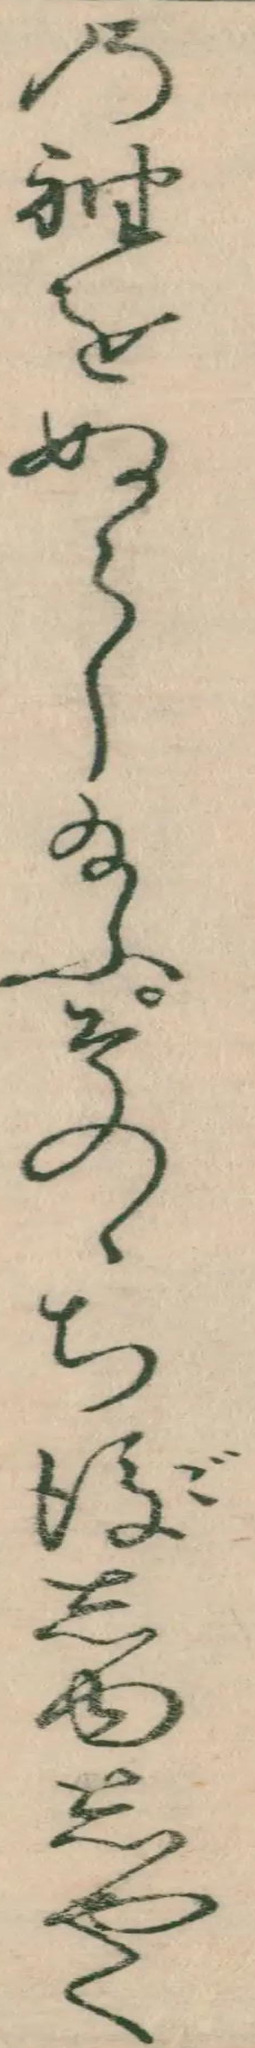の袖をぬらし給ふ。そのゝち後しゆしやく
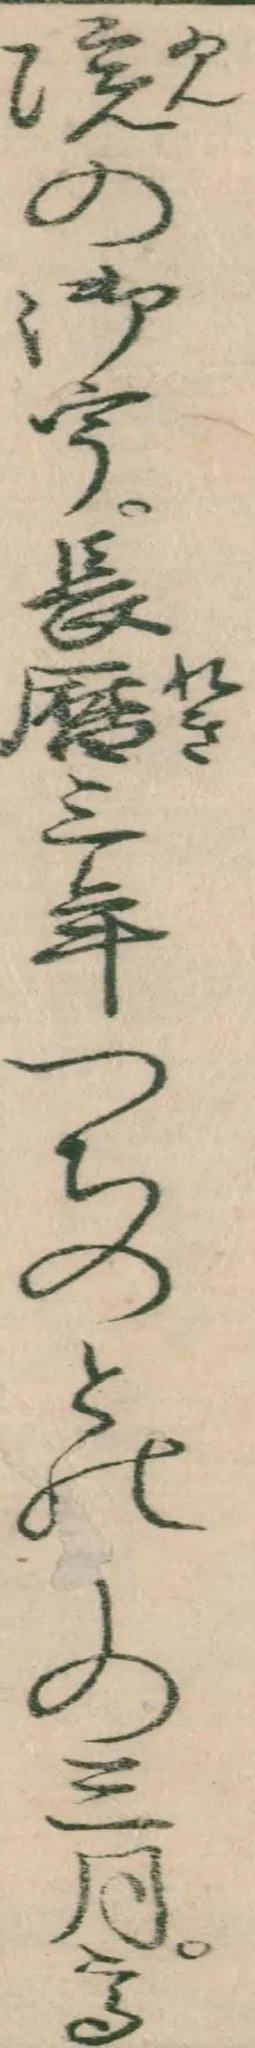院の御宇。長暦三年つちのとのうの三月。高
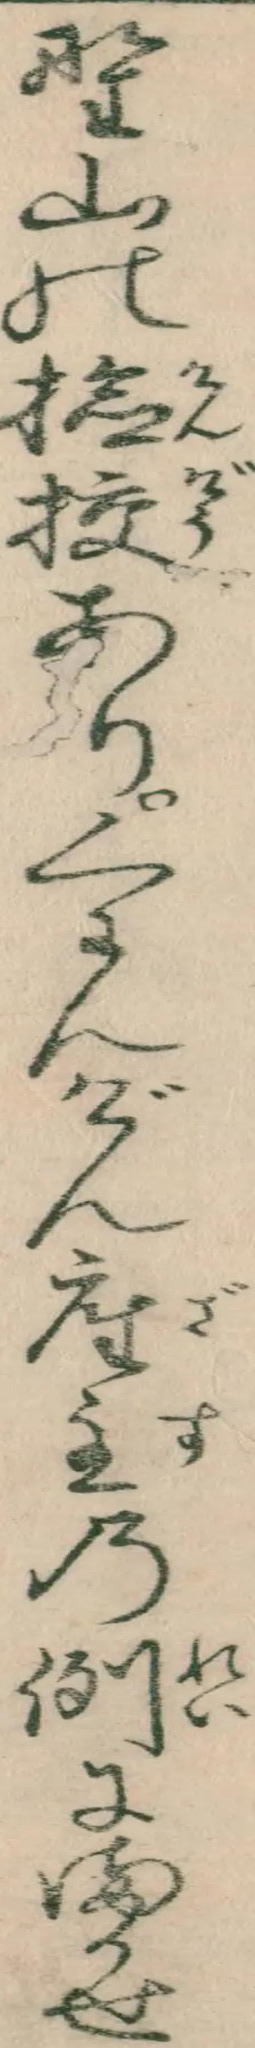野山の検校あり。くわんげん座主の例にまかせ
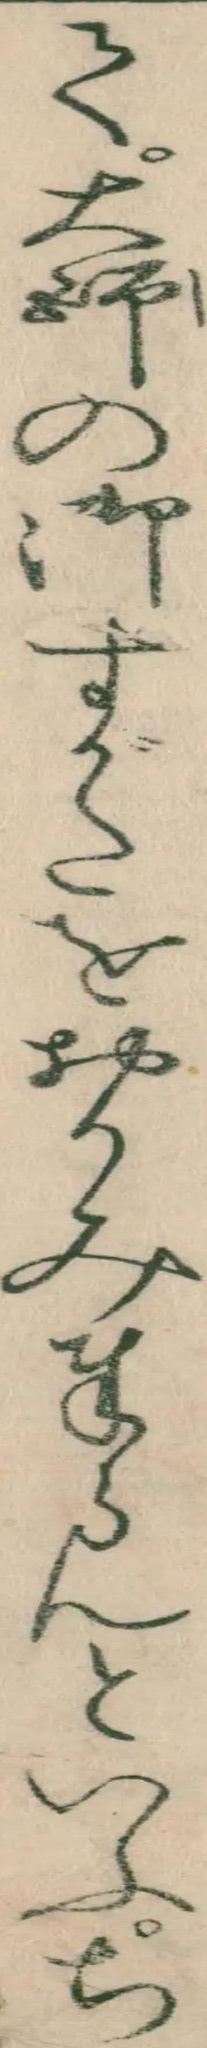て。大師の御すがたをおかみ奉らんといふ。ち
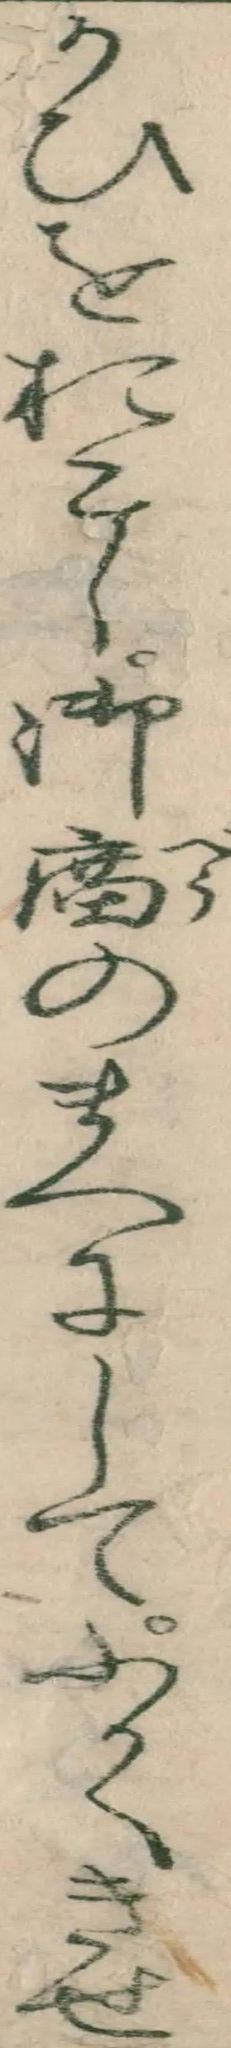かひをおこし。御廟のまへにして。ふかくきせ
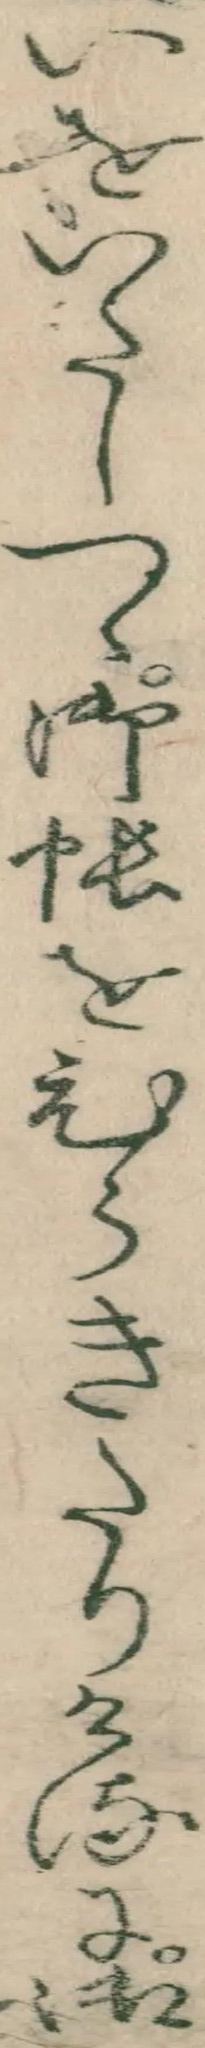いをいたしつゝ。御帳をひらきたりけるに。御
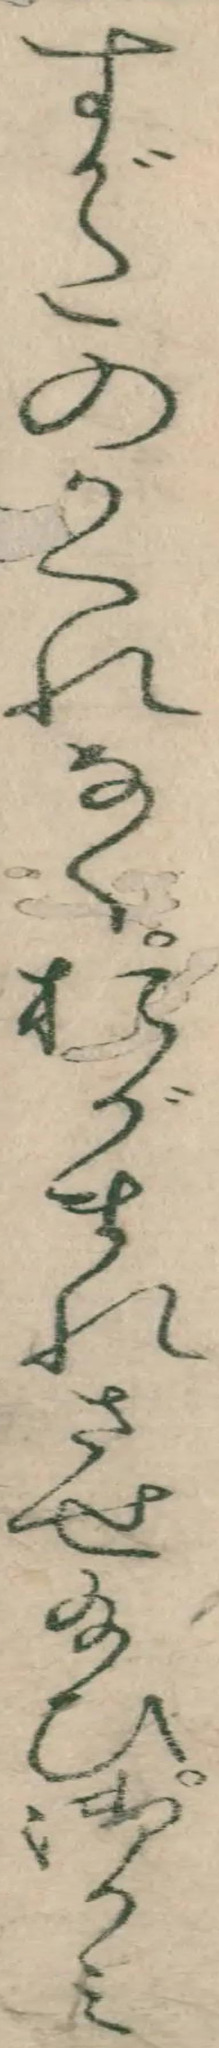すがたのかくれなく。おがまれさせ給ひかみ

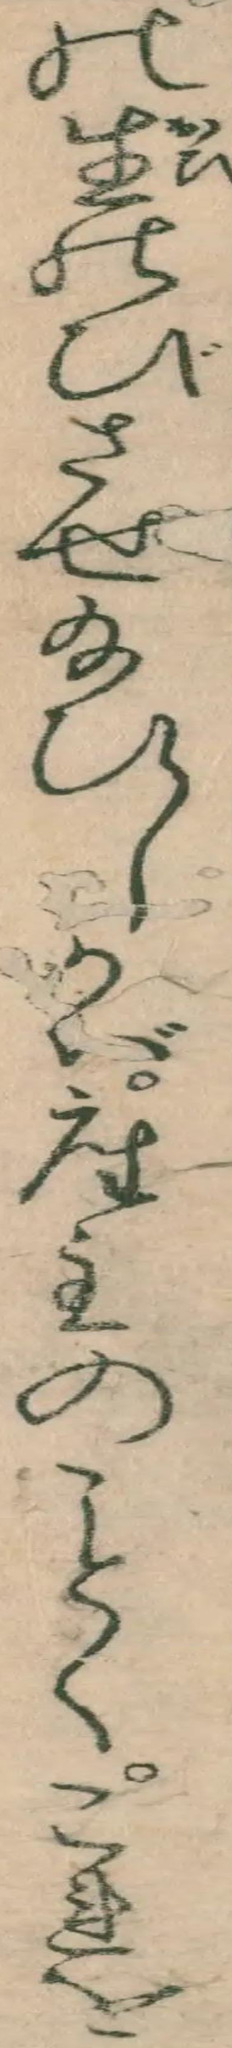の生のびさせ給ひしかば。座主のことく。これを
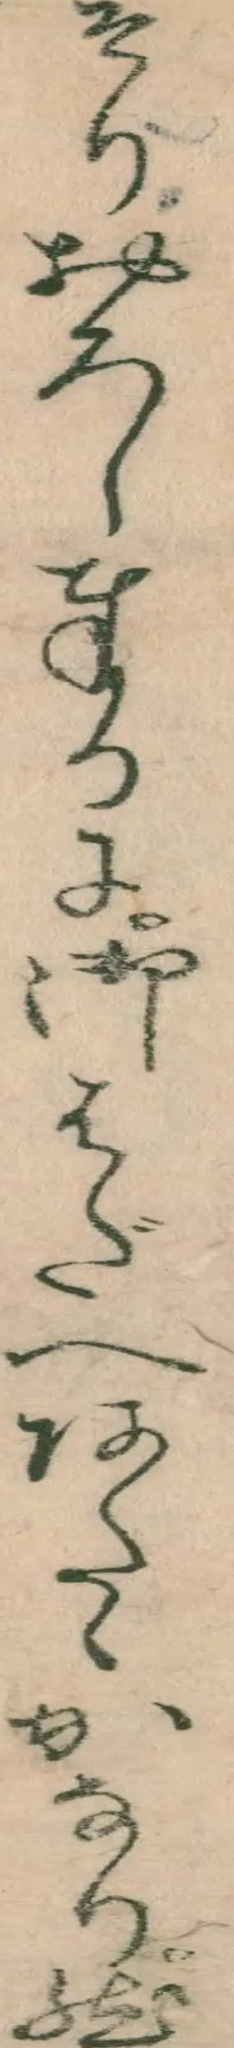そりおろし奉るに。御はだへあたゝかなり。然
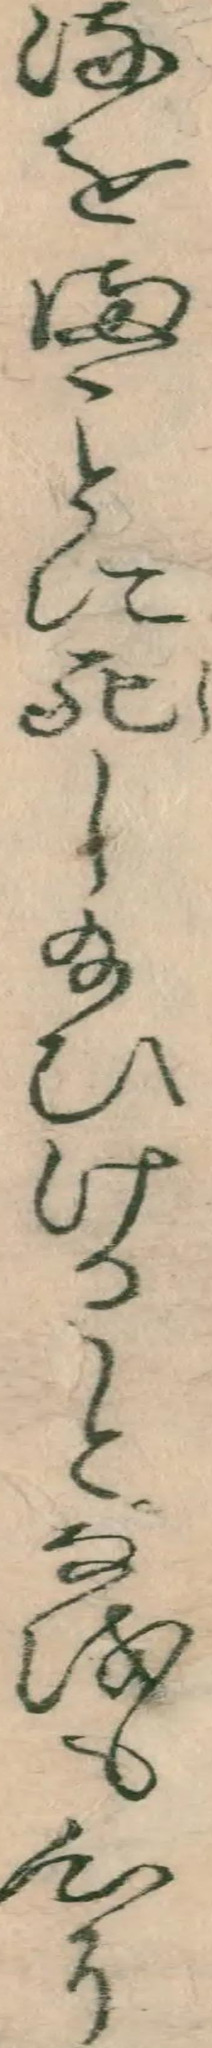るをまことに死したまひけるかとなほも心に
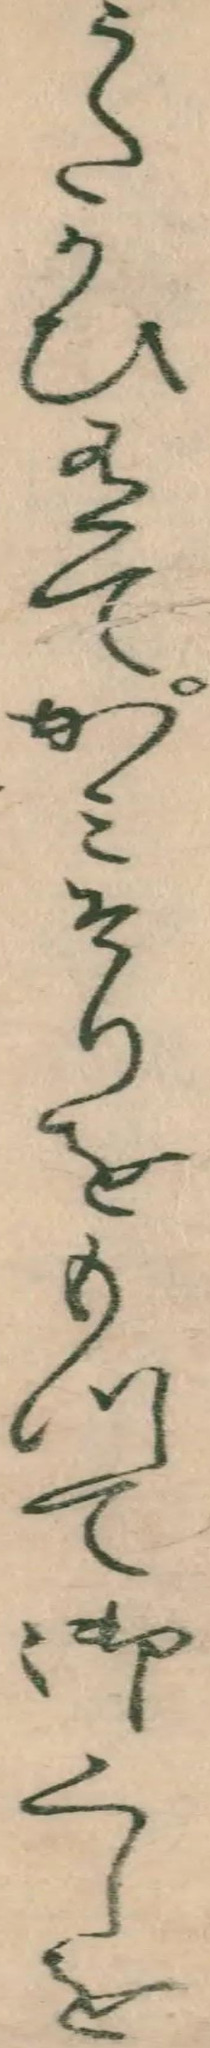うたかひ有て。かみそりをもつて御くしを
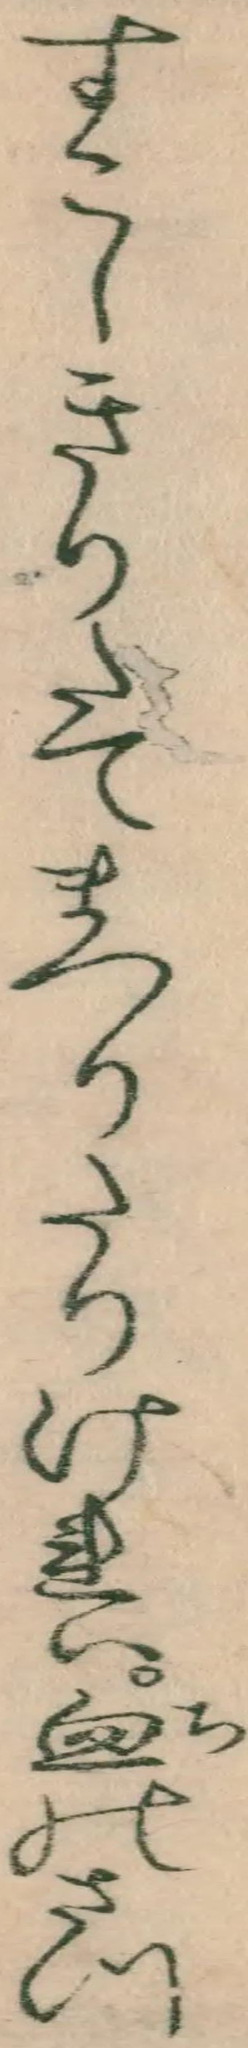すこしきりたてまつりたりけれは。血のさつ
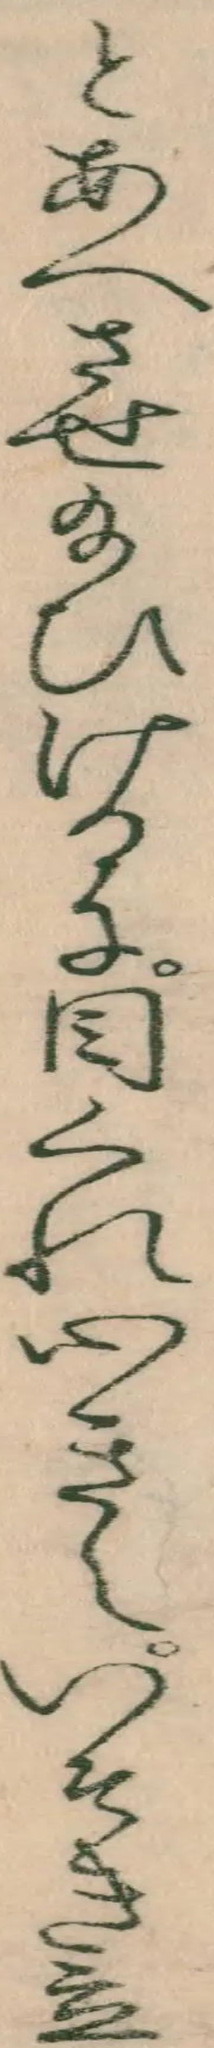とあへさせ給ひけるに。目くれ心きえ。いそき立
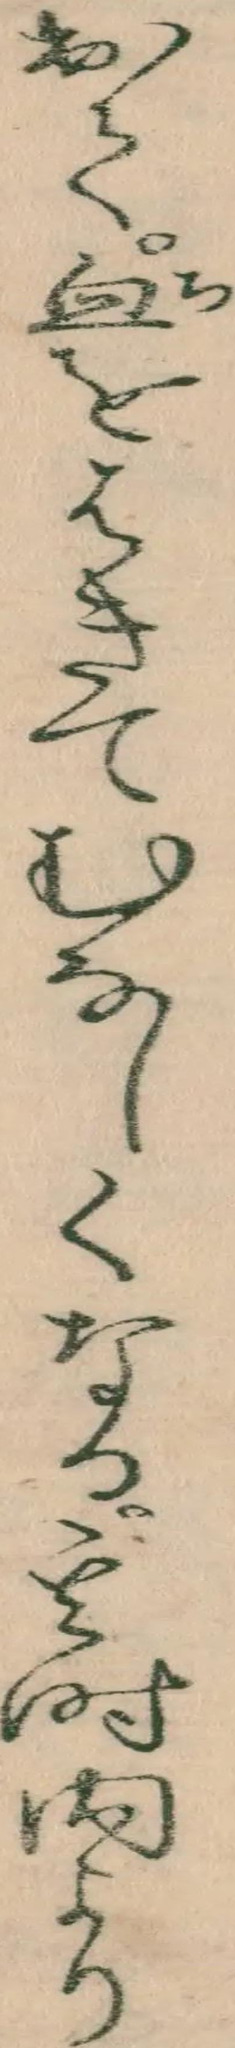出て。血をはきてむなしくなる。其時内より
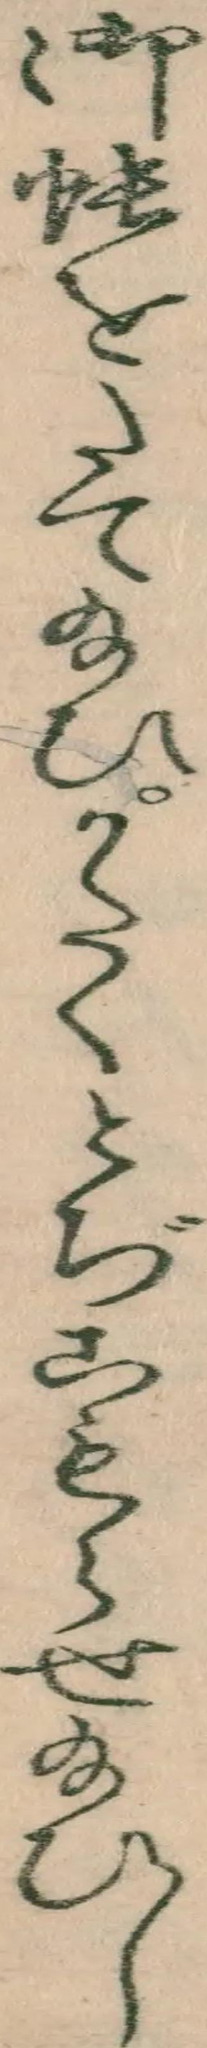御帳をたて給ひ。かたくとぢこもらせ給ひし
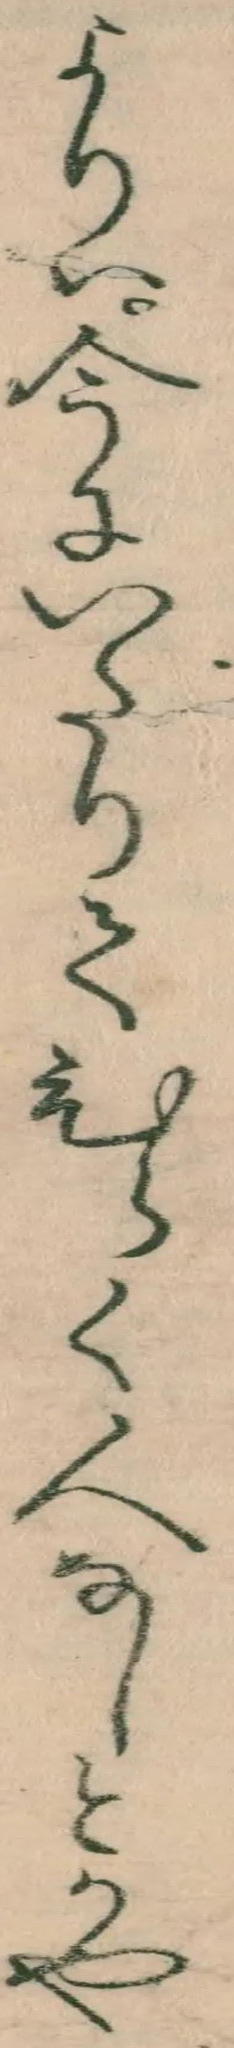よりは。今にいたりてひらく人なしとかや
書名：弘法大師御本地 3巻. [3]
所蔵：国立国会図書館 National Diet Library, JAPAN
